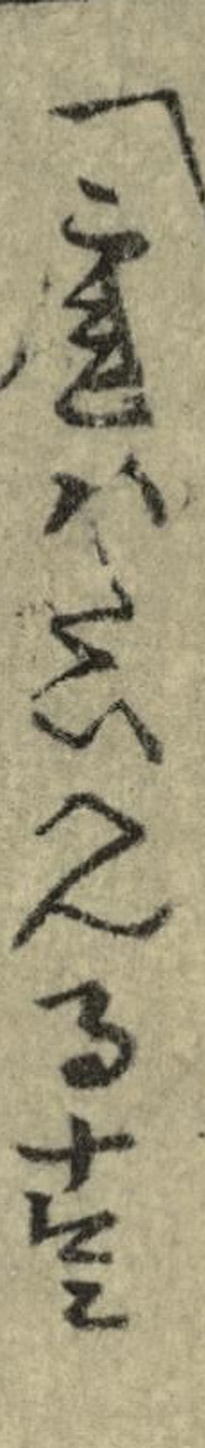〽これはたいへんるすニ
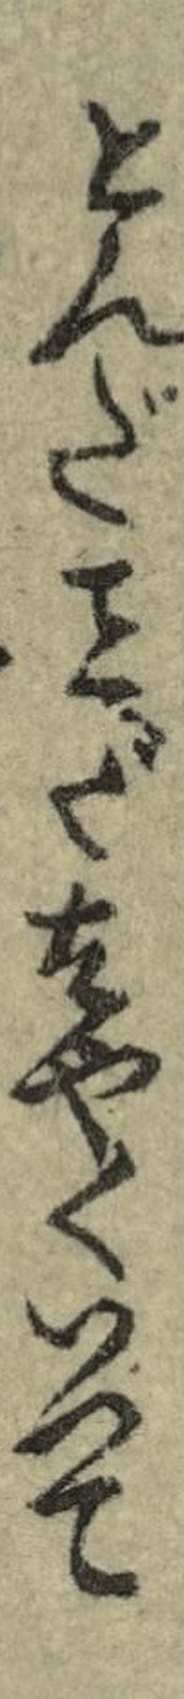とんだことだはやくいつて
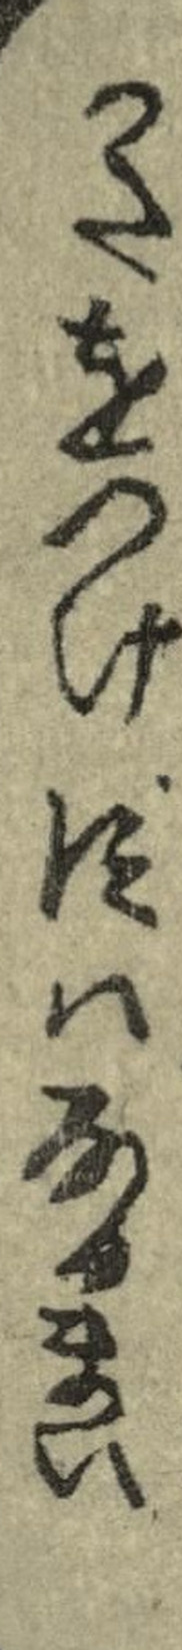かたをつけすはなるまい
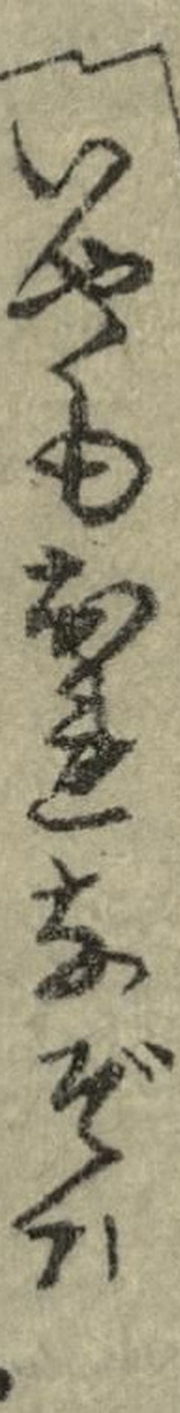〽いやくもおれなぞは
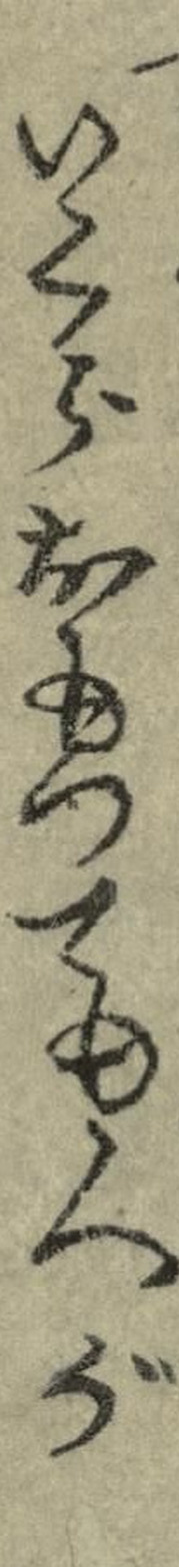いくらおもつても人が
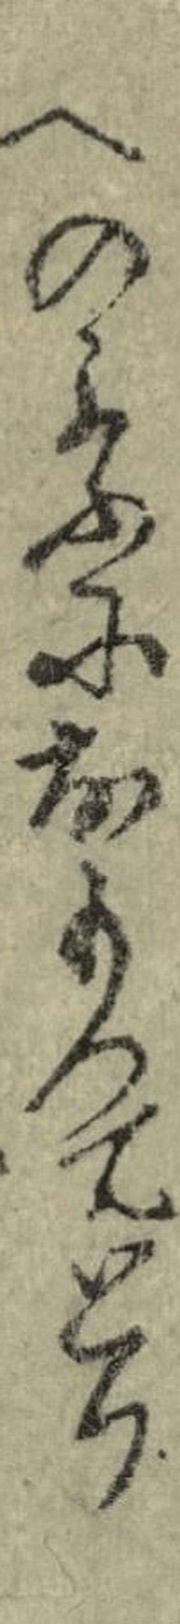へのよふにおもつてとり
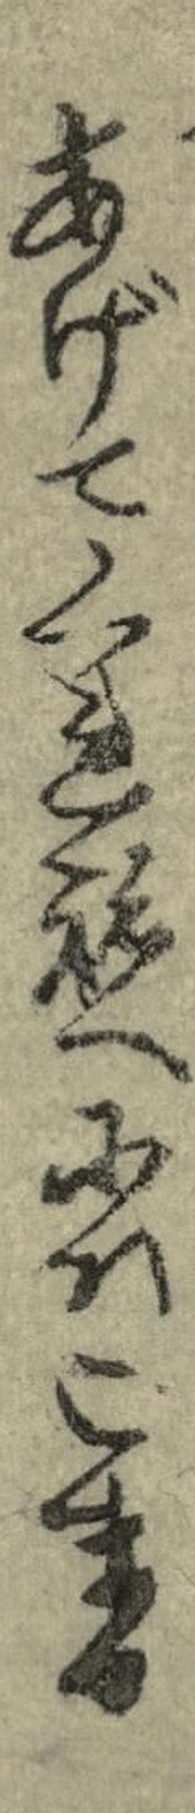あげてくれねへにはこまる
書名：[鯰と要石]
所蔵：東京大学地震研究所図書室 Earthquake Research Institute Library, The University of Tokyo, JAPAN
